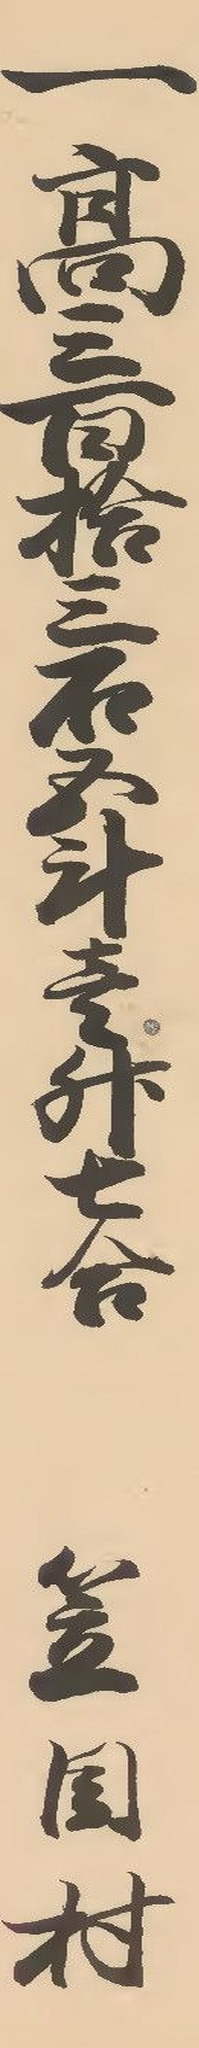一高三百拾三石五斗壱升七合笠目村
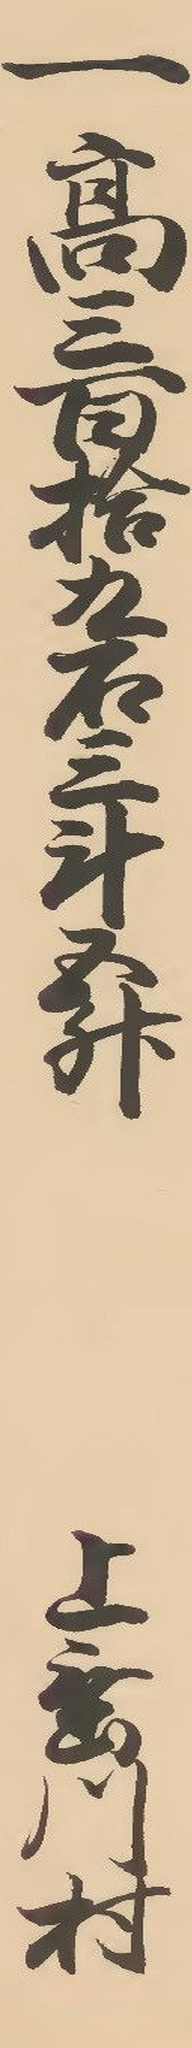一高三百拾九石三斗五升上垂川村
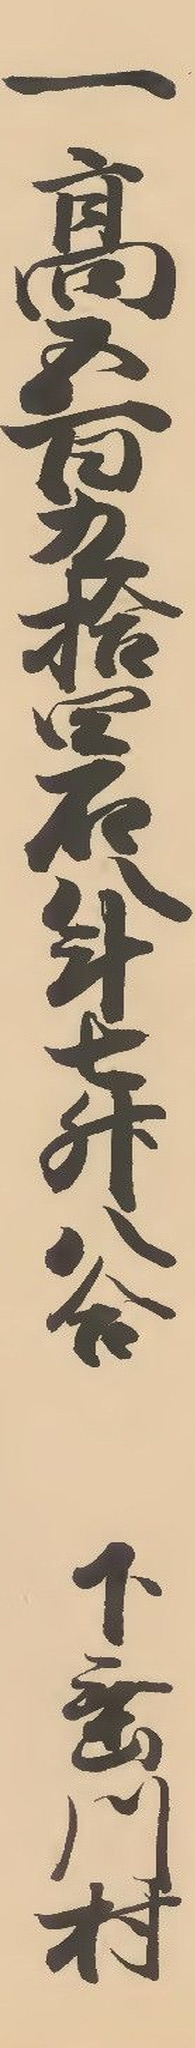一高五百九拾四石八斗七升八合下垂川村
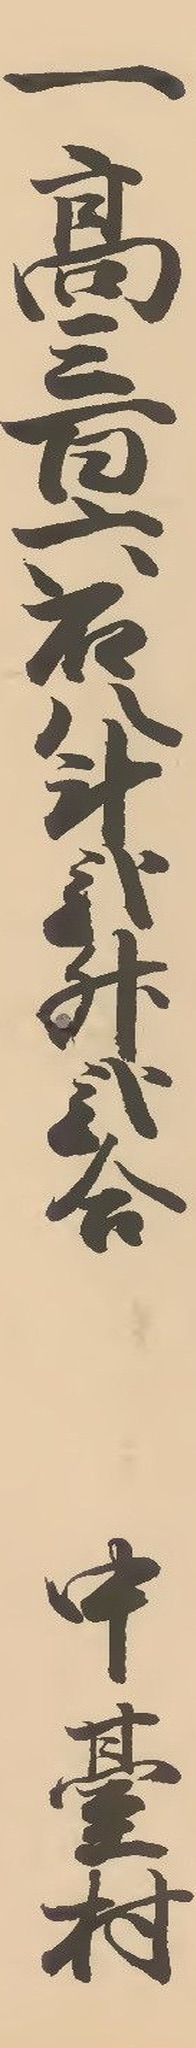一高三百六石八斗弐升弐合中台村
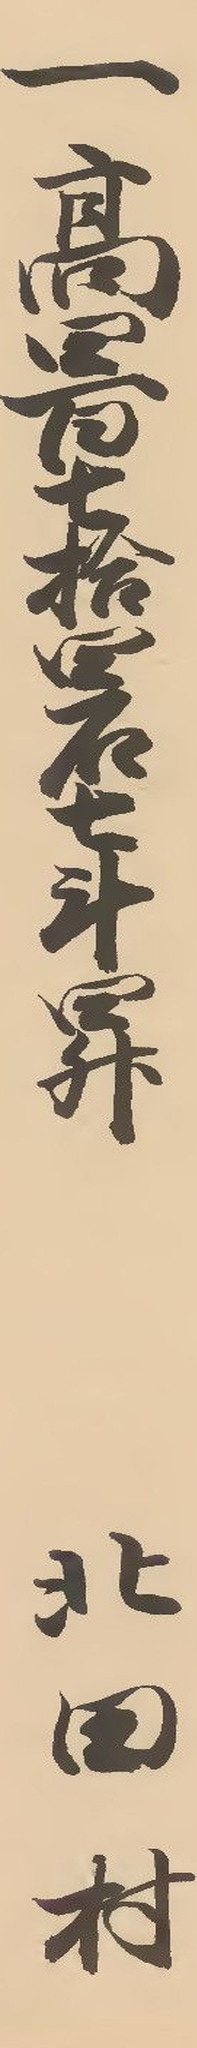一高四百七拾四石七斗四升北田村
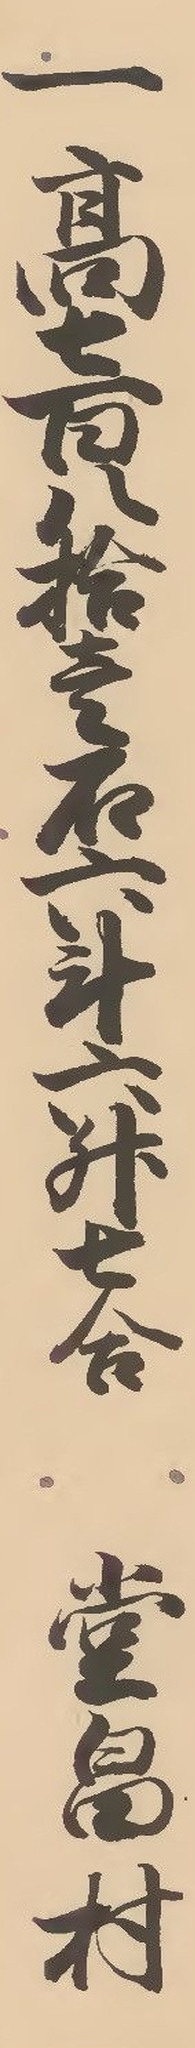一高七百八拾壱石六斗六升七合堂畠村

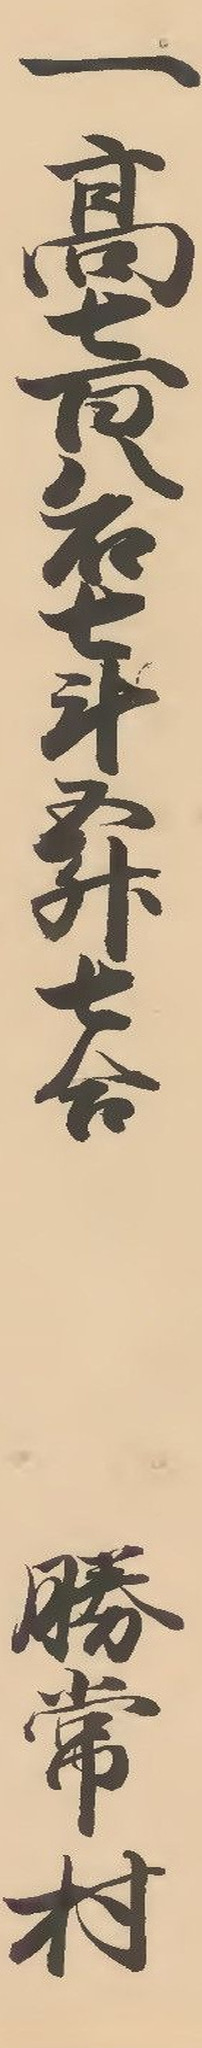一高七百八石七斗五升七合勝常村
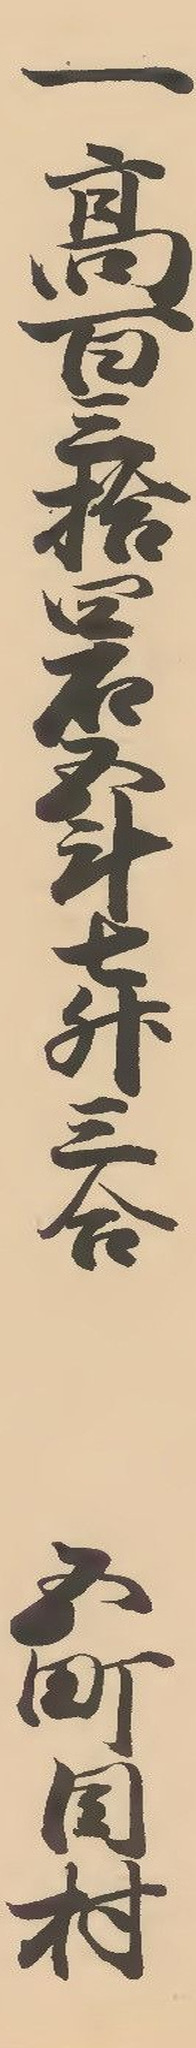一高百三拾四石五斗七升三合五町目村
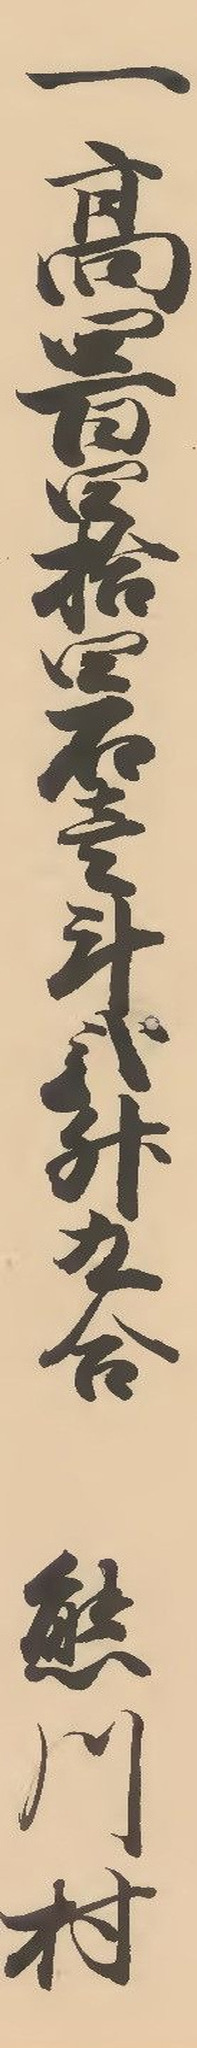一高四百四拾四石壱斗弐升九合熊川村
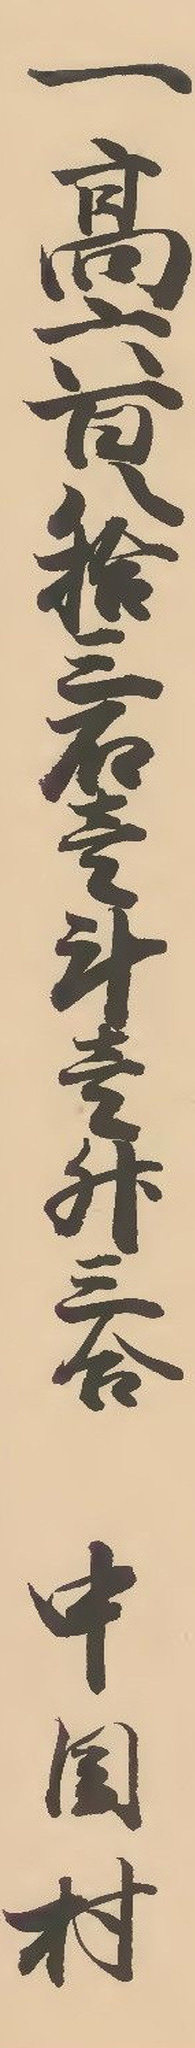一高六百八拾三石壱斗壱升三合中目村
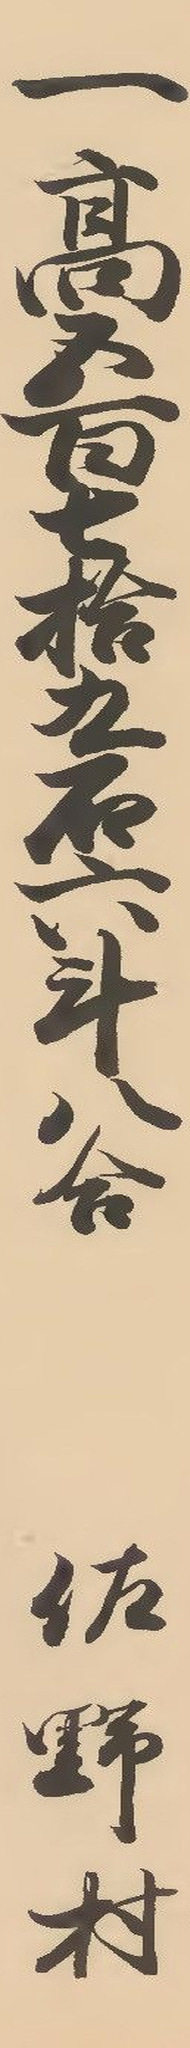一高五百七拾九石六斗八合佐野村
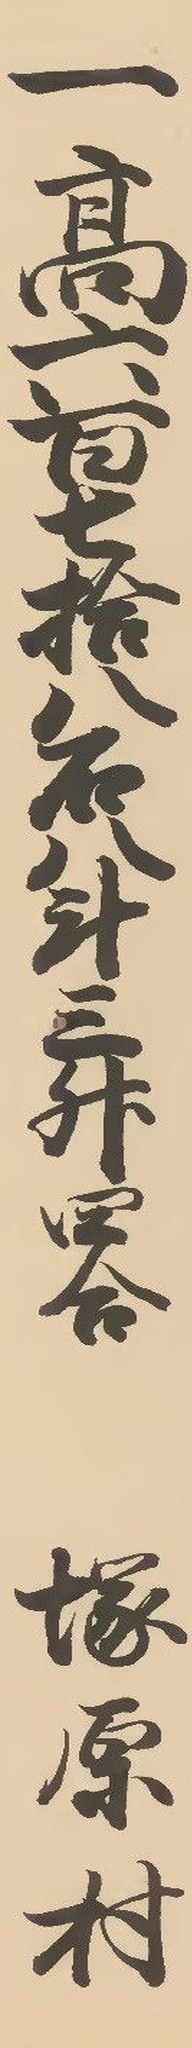一高六百七拾八石八斗三升四合塚原村
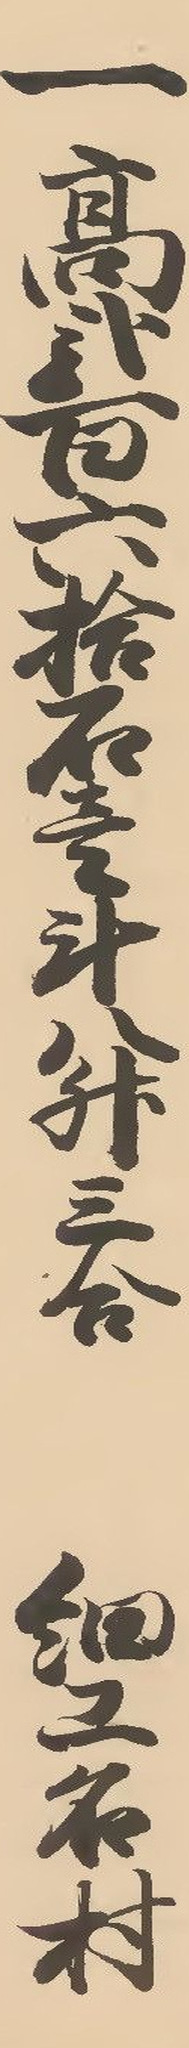一高弐百六拾石壱斗八升三合細工名村
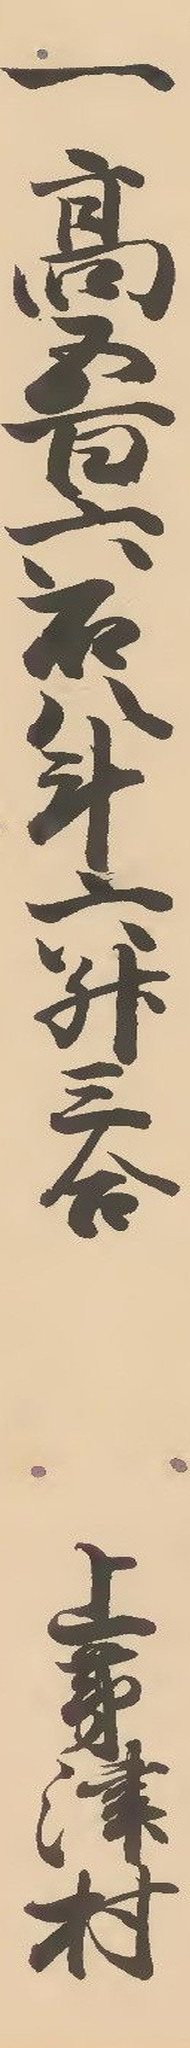一高五百六石八斗六升三合上茅津村

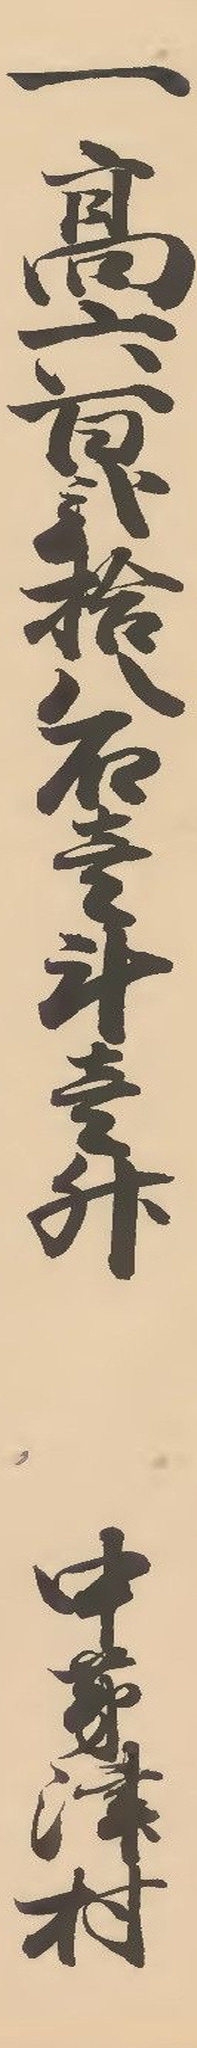一高六百弐拾八石壱斗壱升中茅津村
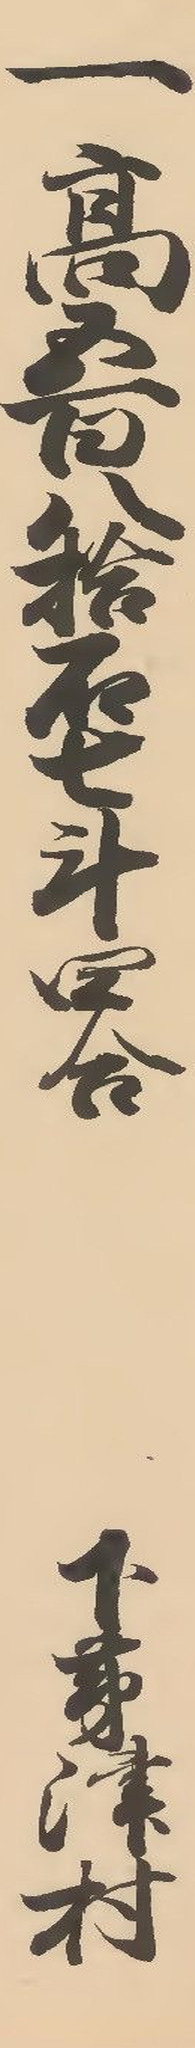一高五百八拾石七斗四合下茅津村
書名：陸奥国郷帳　１
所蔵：国立公文書館 National Archives of Japan
